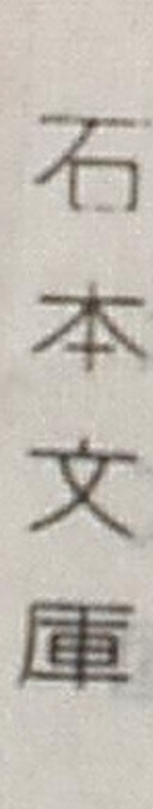石本文庫-
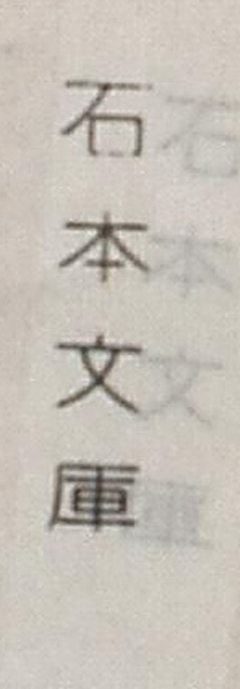石本文庫-

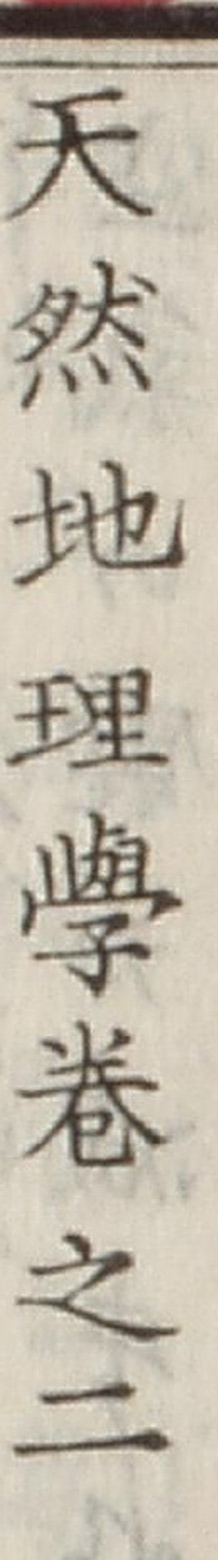天然地理學巻之二
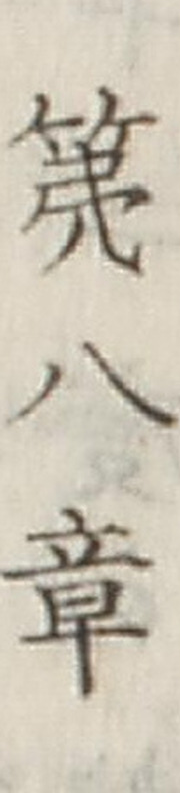第八章
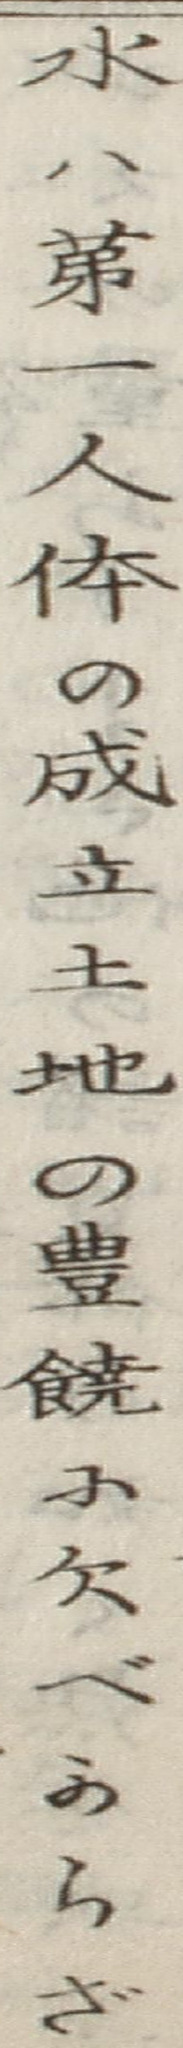水は第一人体の成立土地の豊饒に欠べからざ
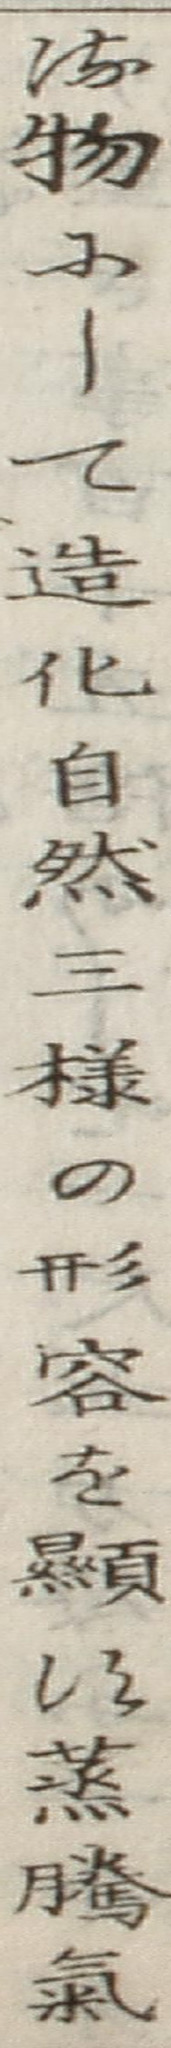る物にして造化自然三様の形容を顕す蒸騰氣
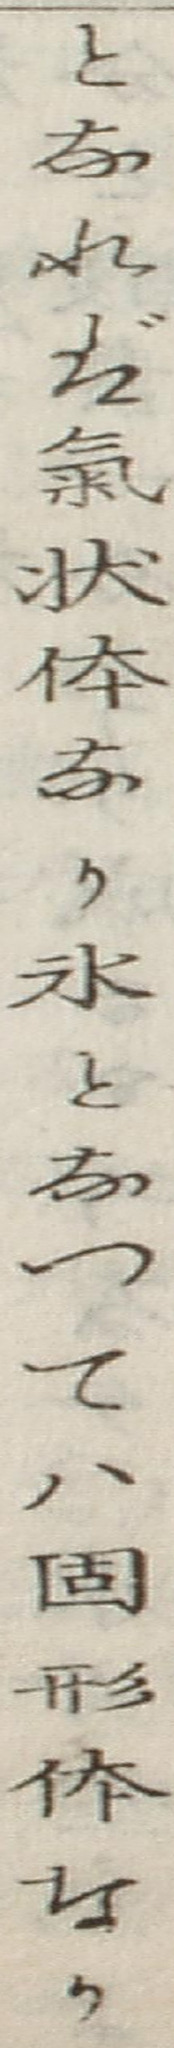となれば氣状体なり氷となつては固形体なり
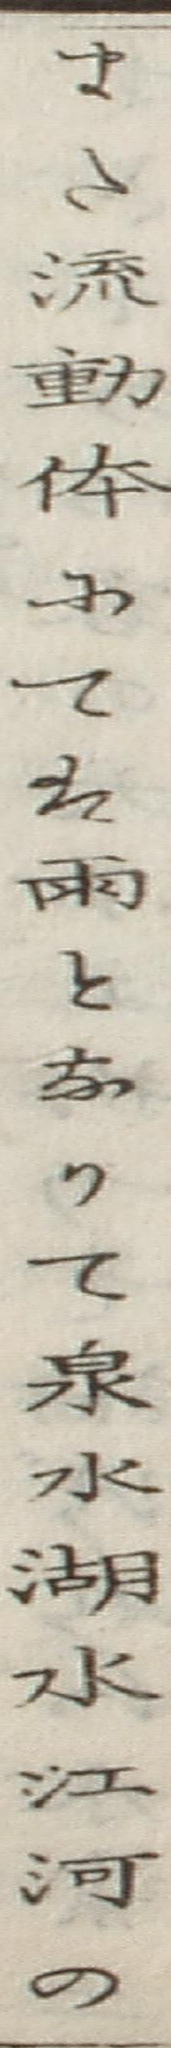また流動体にては雨となりて泉水湖水江河の
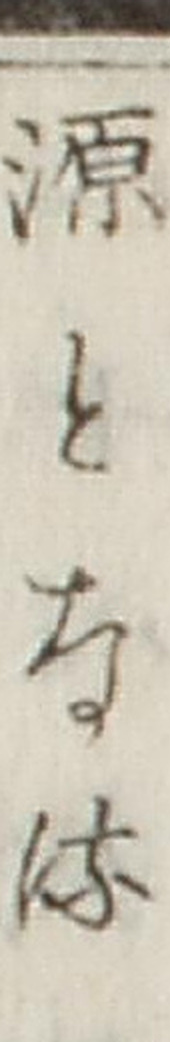源となる
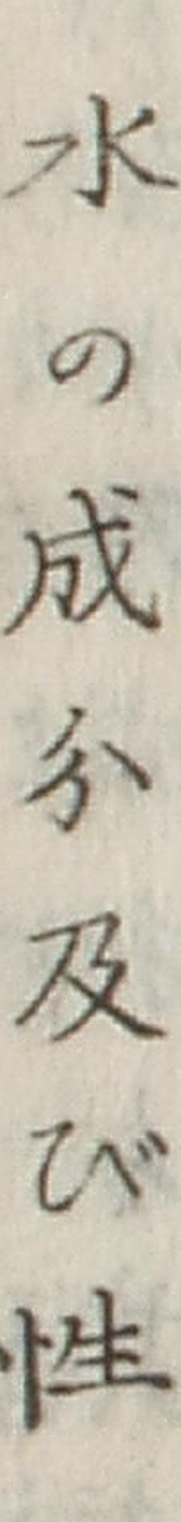水の成分及び性

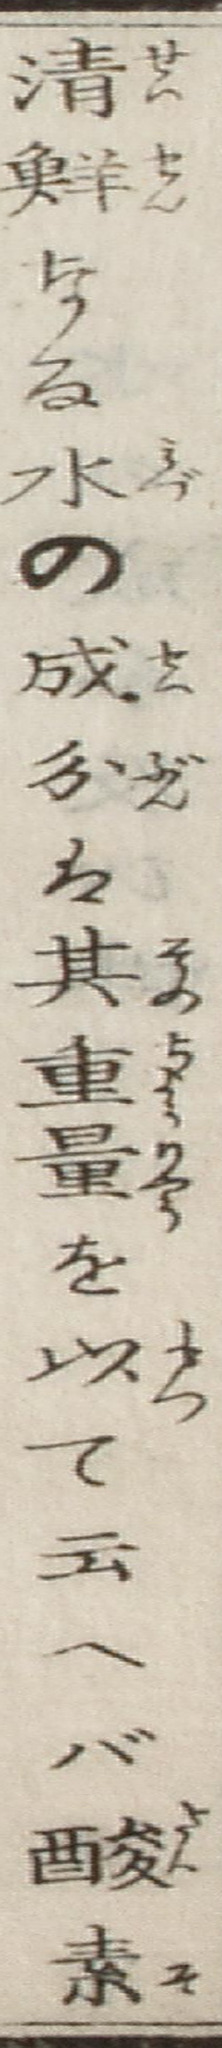清鮮なる水の成分は其重量を以て云ヘば酸素
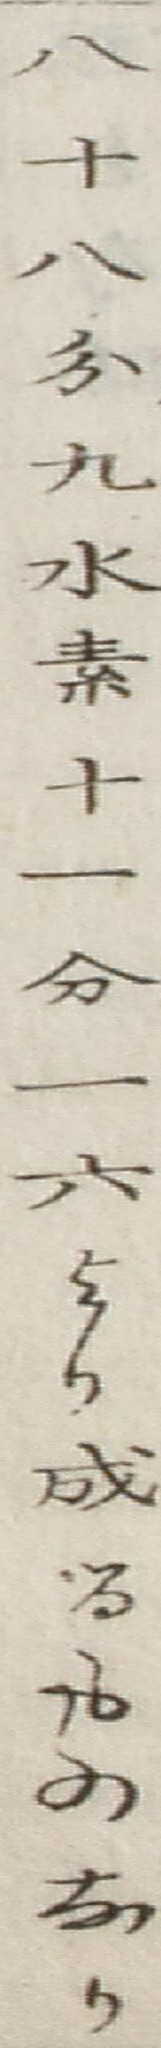八十八分九水素十一分一六より成るものなり
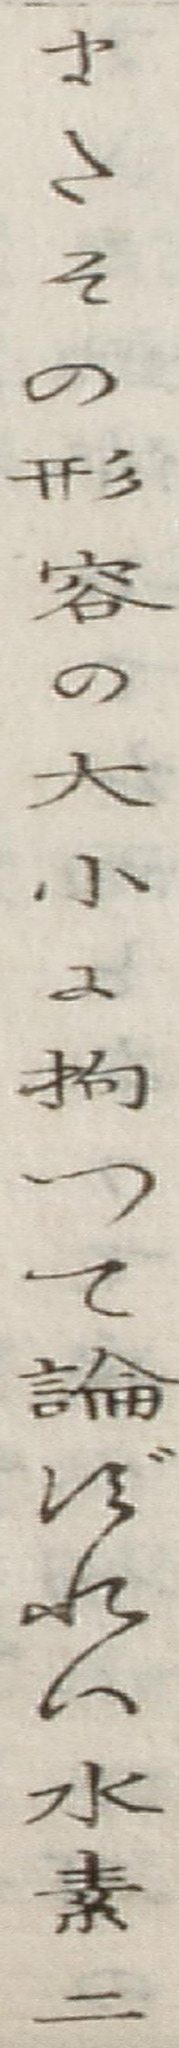またその形容の大小に拘つて論ずれは水素二
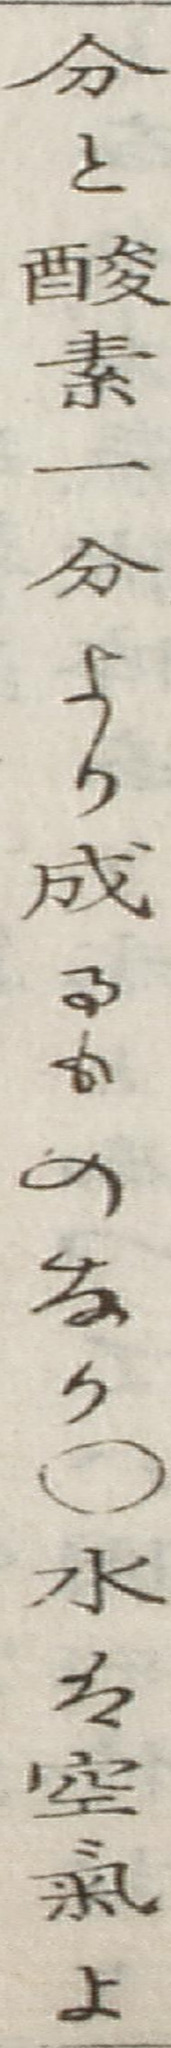分と酸素一分より成るものなり○水は空気よ
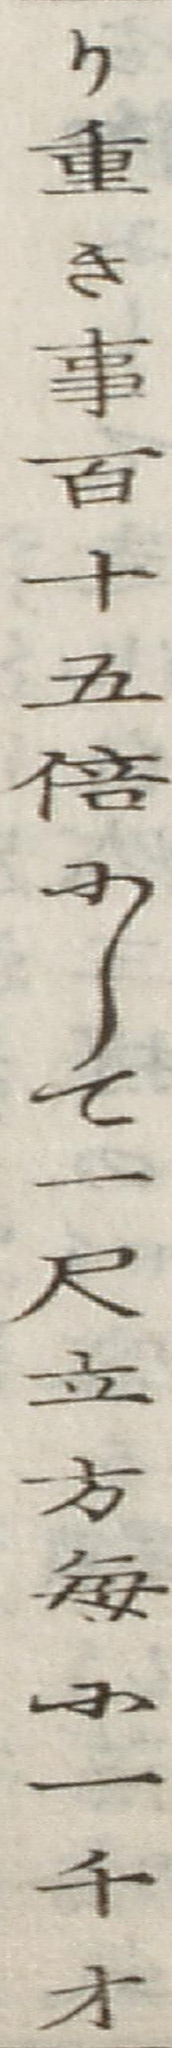り重き事百十五倍にして一尺立方毎に一千オ
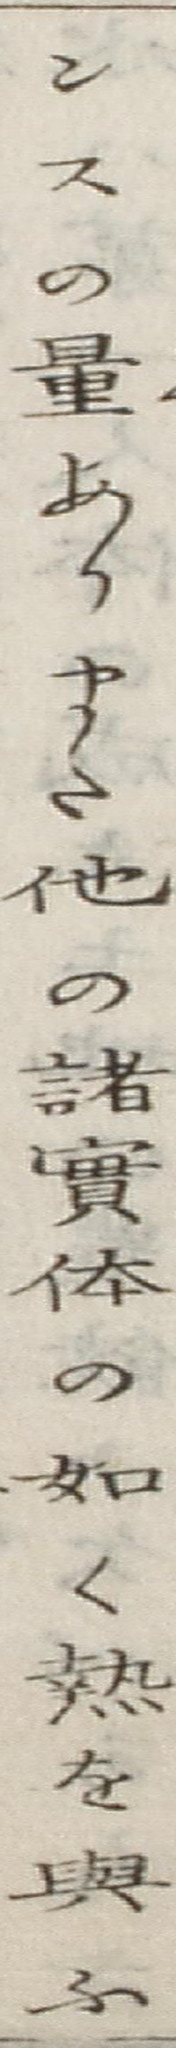ンスの量ありまた他の諸実体の如く熱を与ふ
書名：訓蒙　天然地理學　中
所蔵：東京大学地震研究所図書室 Earthquake Research Institute Library, The University of Tokyo, JAPAN
